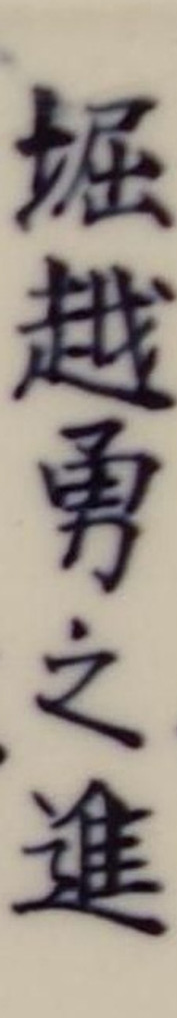堀越勇之進
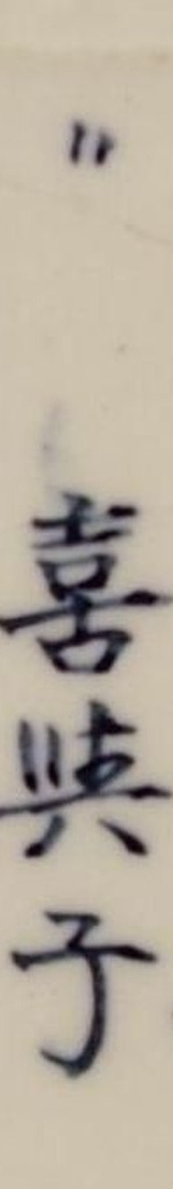喜与子
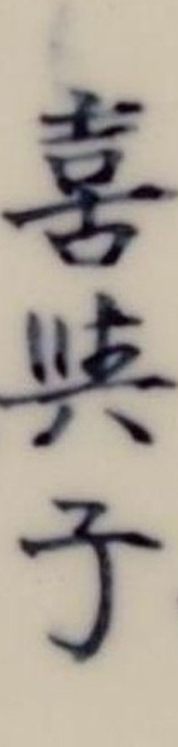喜与子
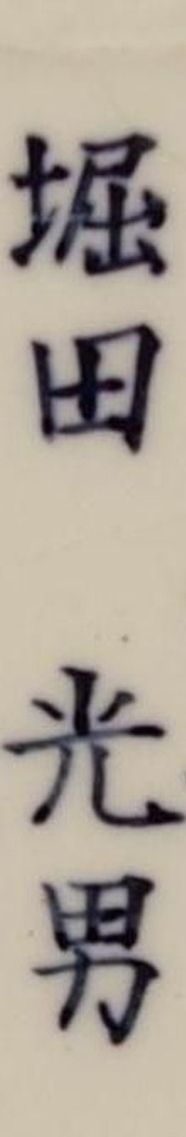堀田光男
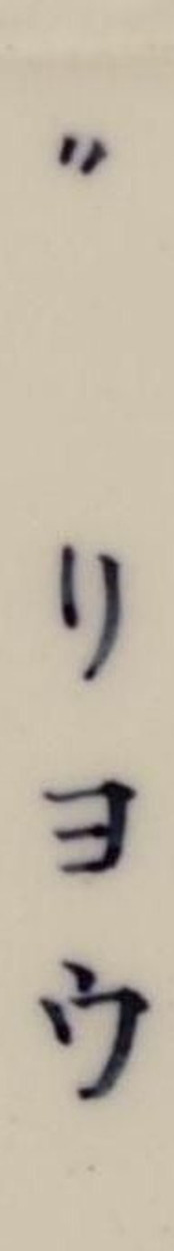リヨウ
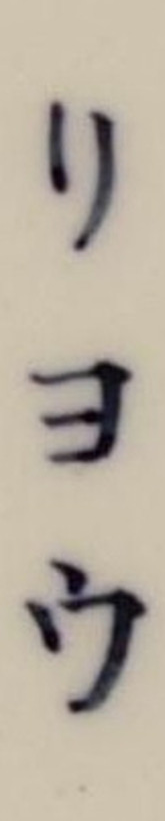リヨウ
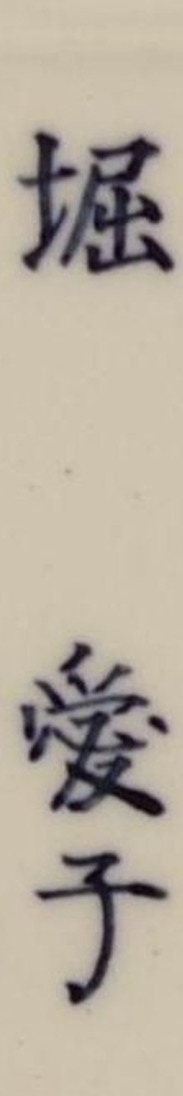堀愛子
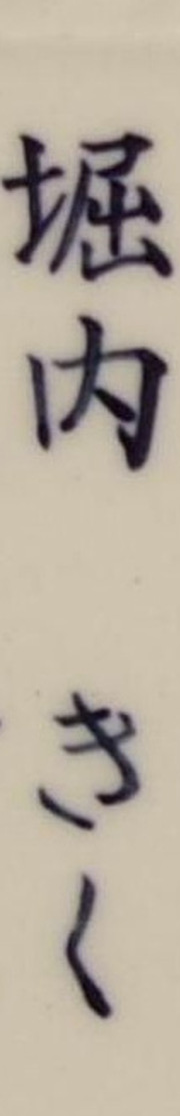堀内きく
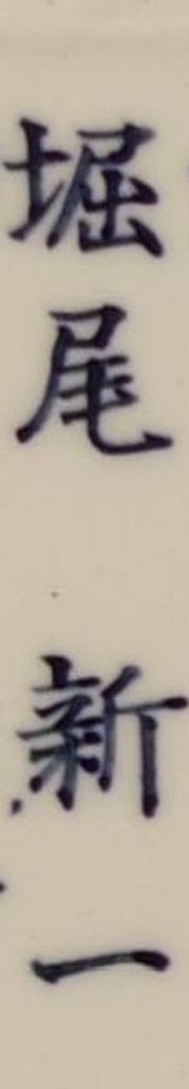堀尾新一
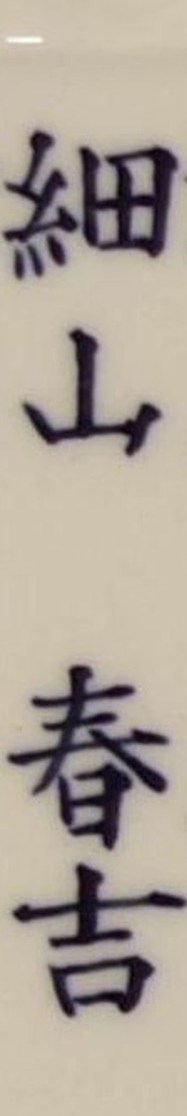細山春吉
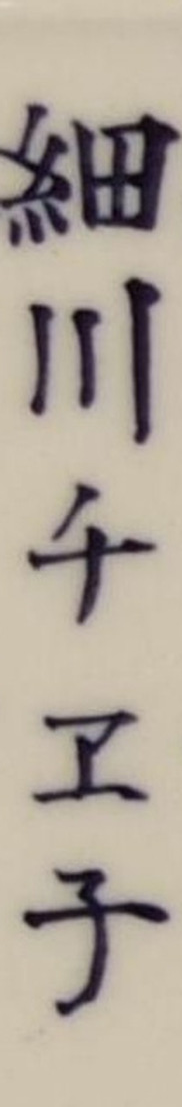細川チエ子
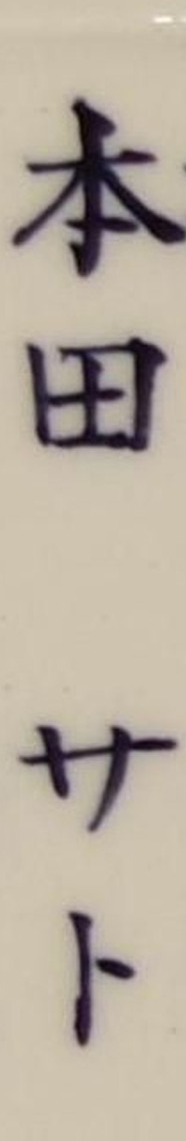本田サト
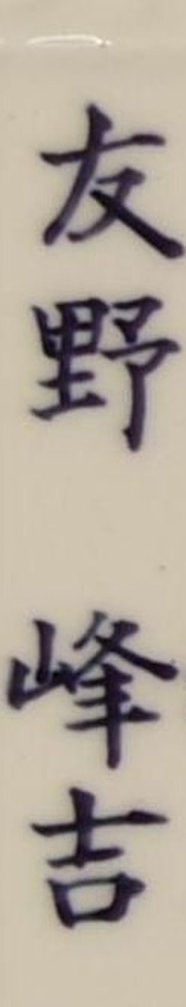友野峰吉

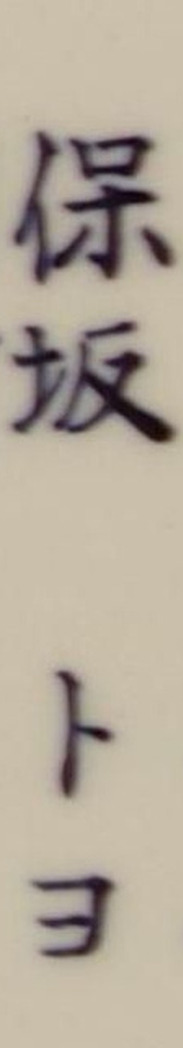保坂トヨ
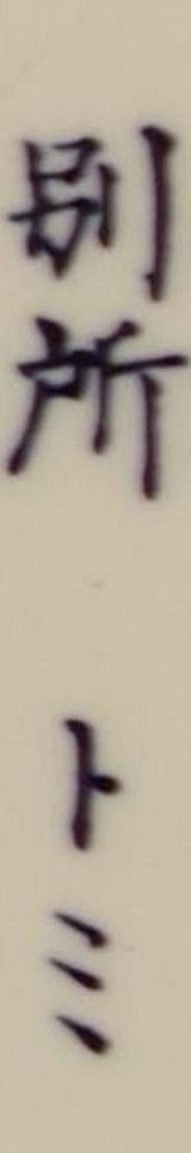別所トミ
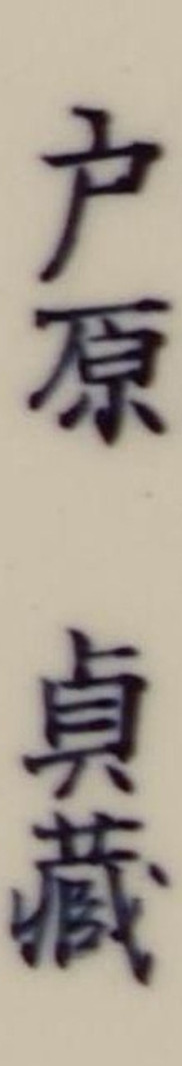戸原貞蔵
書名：M~S
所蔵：高野山金剛峯寺
